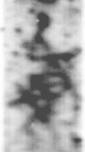○（伐）
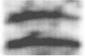二
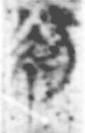紫
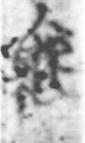○（紕）
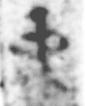屯
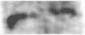一
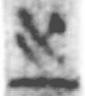之
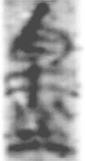墨
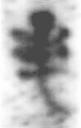毛
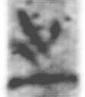之
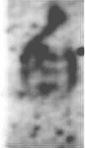首
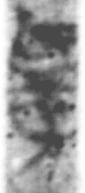○（緅）
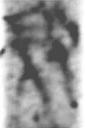敗
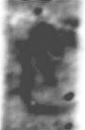○（鞍）
